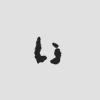曰
